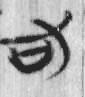右
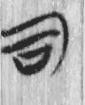司
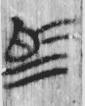馬
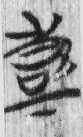彭
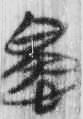懌
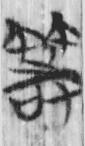等
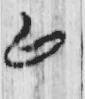㠯（以）
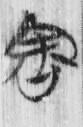舍
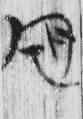陰
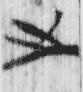之
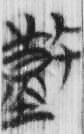○（勤）
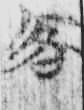客
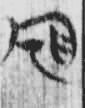陰
